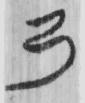乃
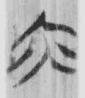亦
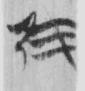隹
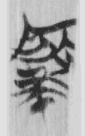肇
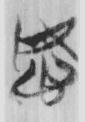悔
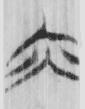亦
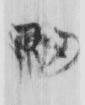則
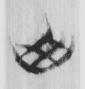匄
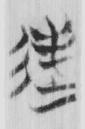送
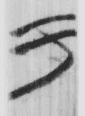于
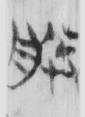朕
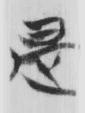是
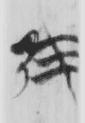隹
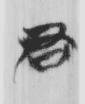君
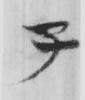子
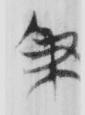秉
